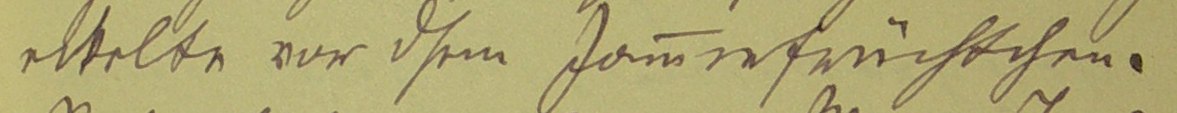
eckelte vor dsem Jammerfrüchtchen.
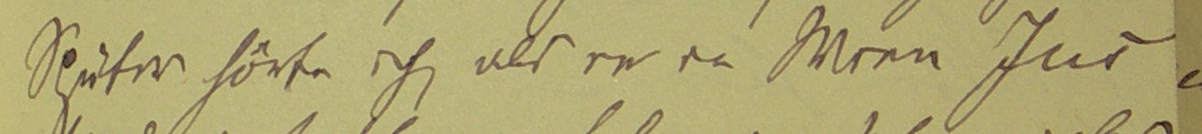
Später hörte ich, als er in Wien Jus
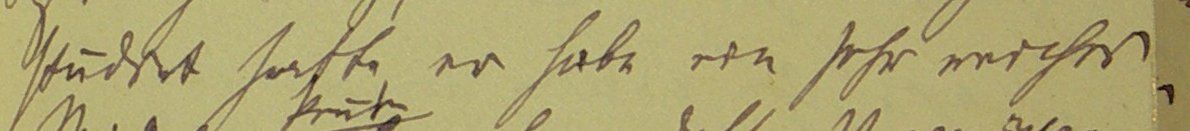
studiert hatte, er habe ein sehr reiches
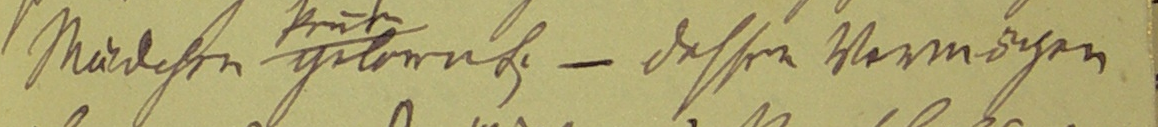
Mädchen gelernt; - dessen Vermögen
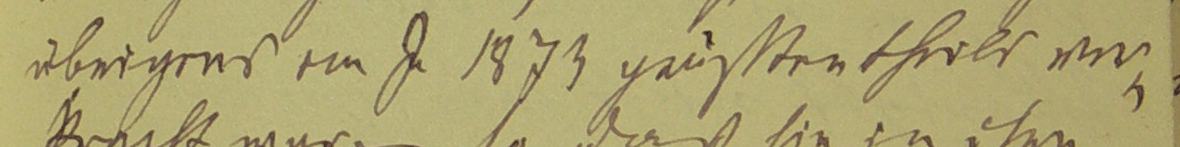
übrigens im J. 1873 größtentheils ver¬
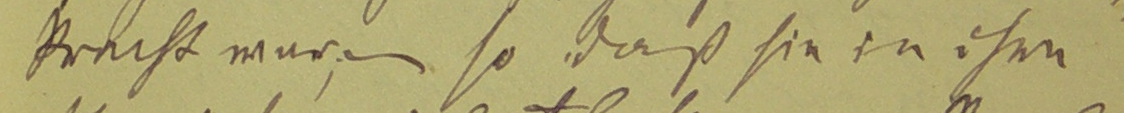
kracht war, - so daß sie in ihre
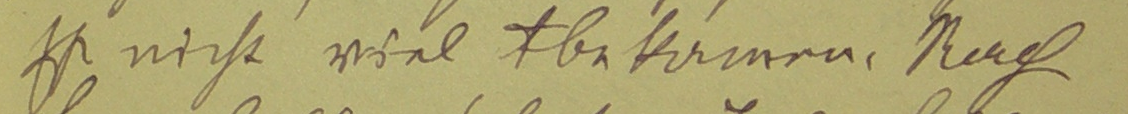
Ehe nicht viel tbekomme. Nach
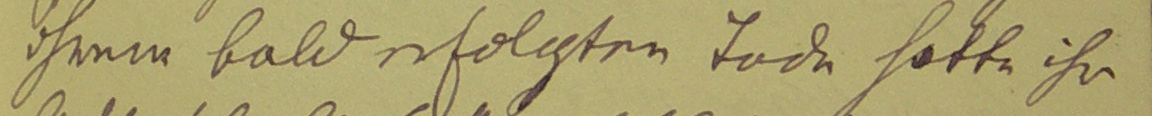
ihrem bald erfolgtem Tode hatte ihr
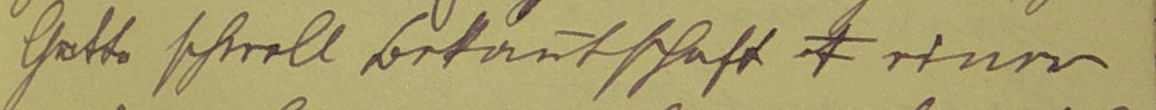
Gatte schnell Bekanntschaft t einer
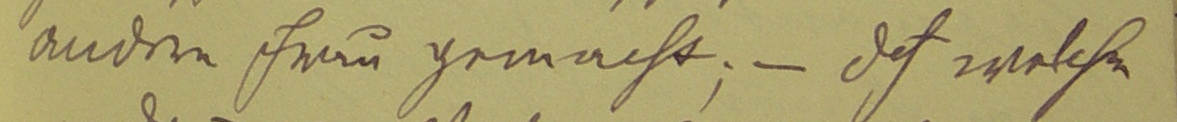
anderen Frau gemacht; - Dch welche
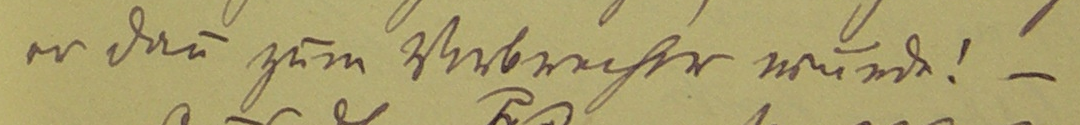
er dann zum Verbrecher wurde! -
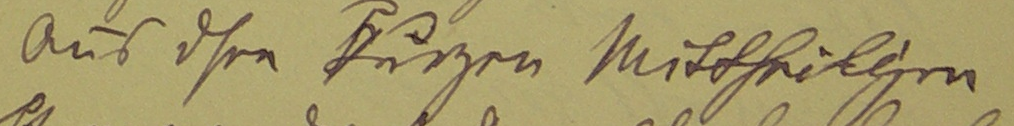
Aus dseN kurzen Mittheilgen
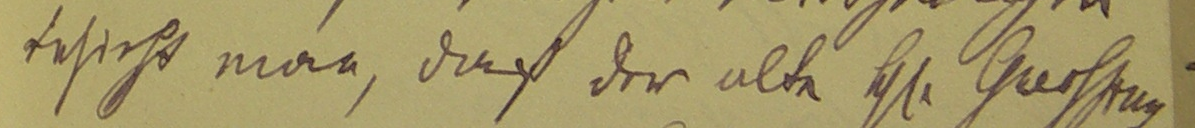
ersieht man daß der alte Hr. Greissing
